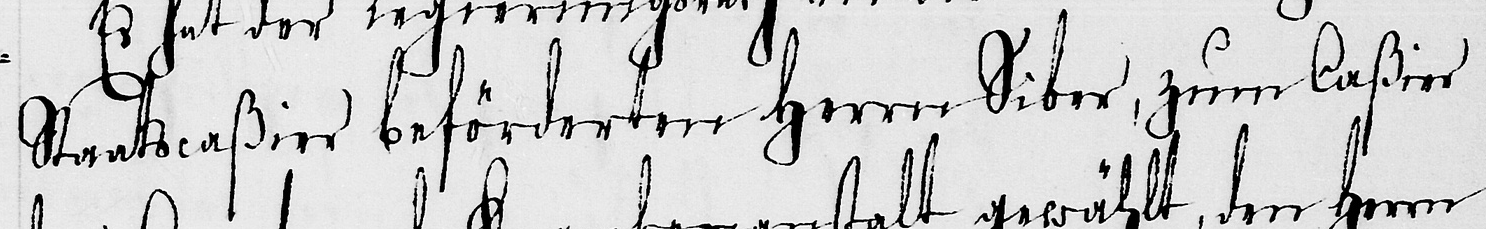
Staatscaßier beförderten Herrn Siber, zum Caßier
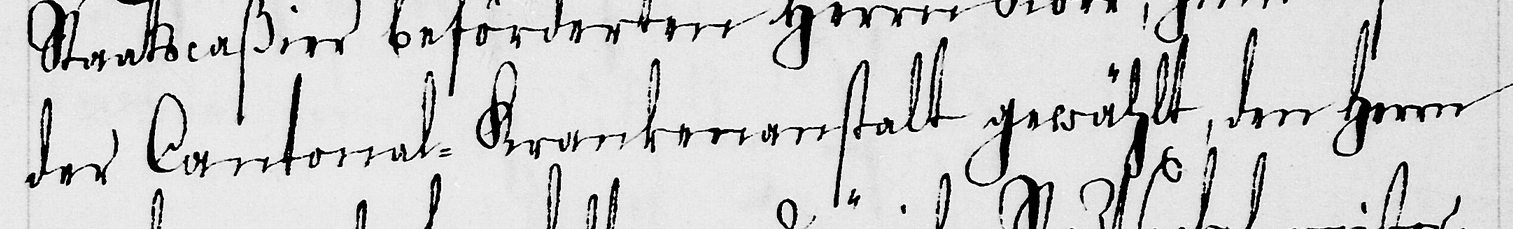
der Cantonal-Krankenanstalt gewählt, den Herrn
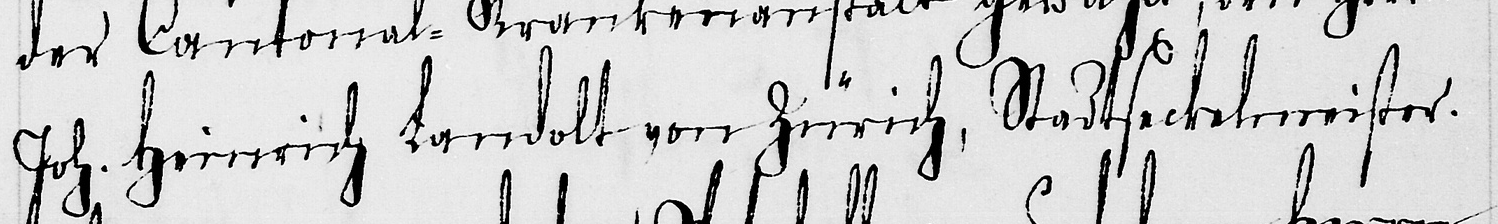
Joh. Heinrich Landolt von Zürich, Stadtseckelmeister.
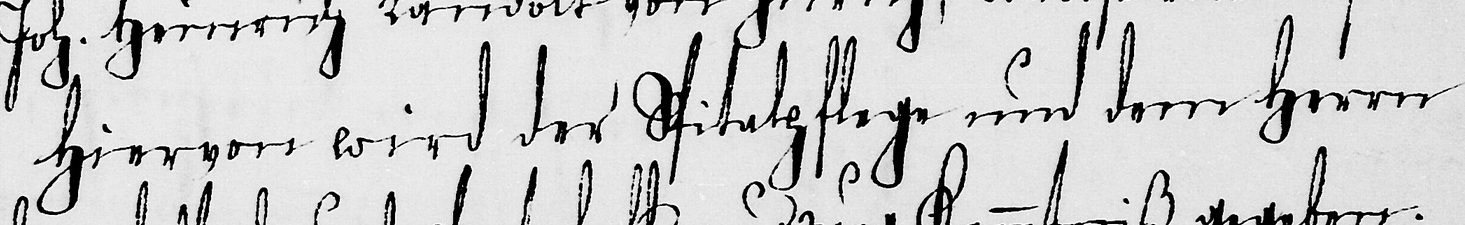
Hiervon wird der Spitalpflege und dem Herrn
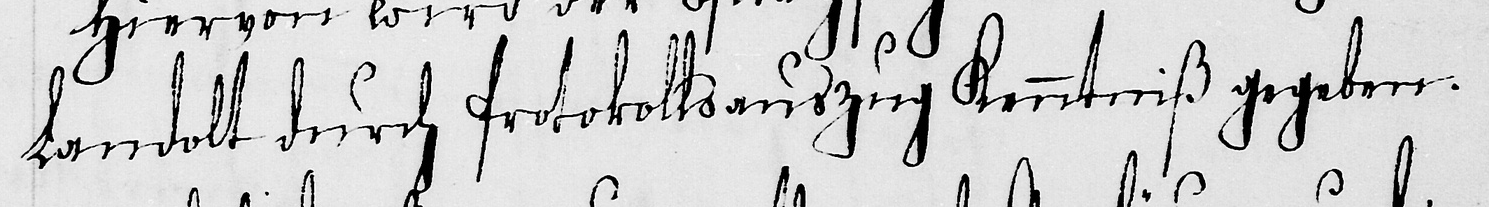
Landolt durch Protokollsauszug Kenntniß gegeben.
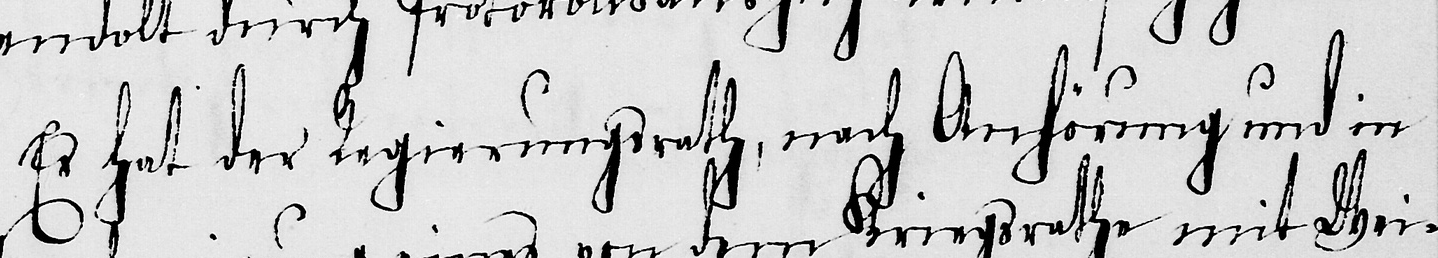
Es hat der Regierungsrath, nach Anhörung und in
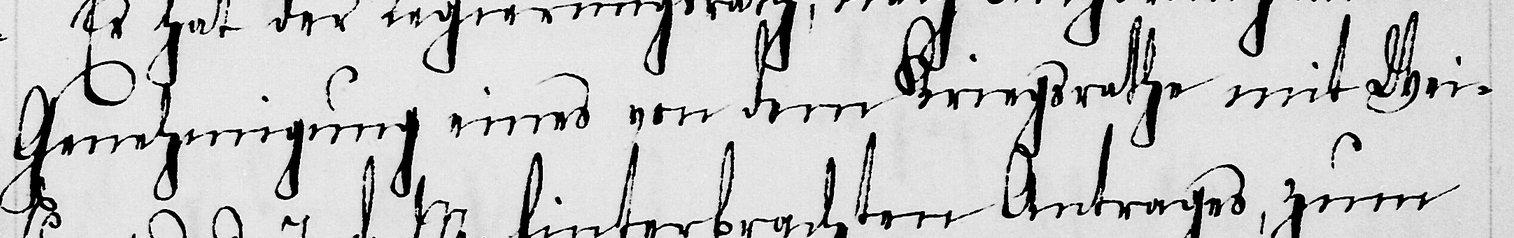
Genehmigung eines von dem Kriegsrathe mit Wei¬
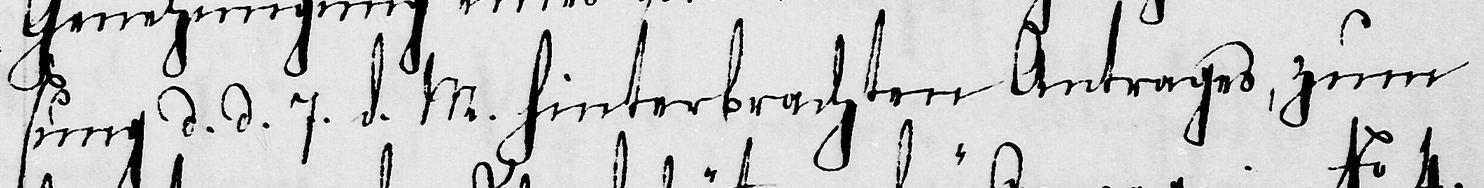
sung d. d. 7. d. M. hinterbrachten Antrages, zum
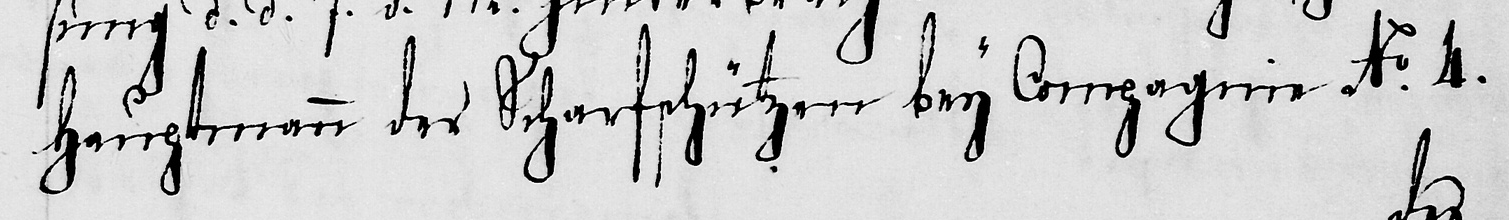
Hauptmann der Scharfschützen bey Compagnie N°. 4.
